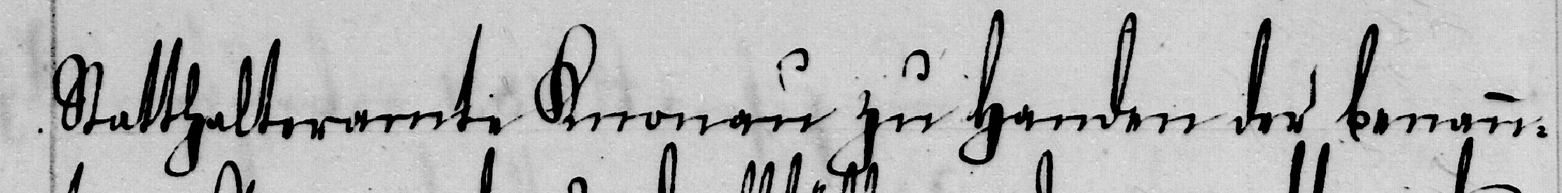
Statthalteramte Knonau zu Handen der benann¬
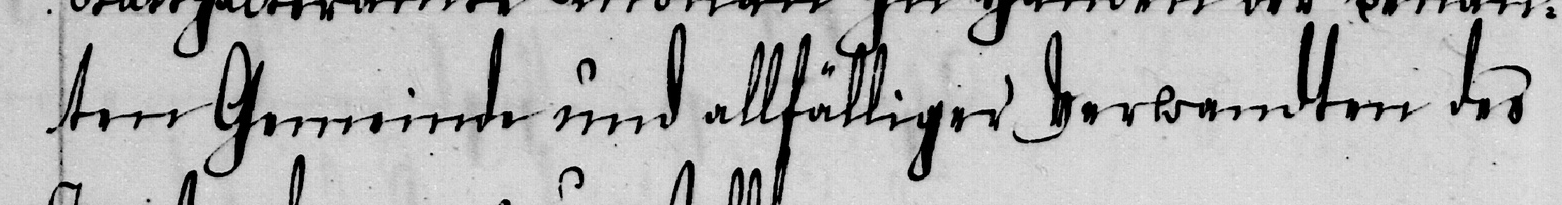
ten Gemeinde und allfälliger Verwandten des
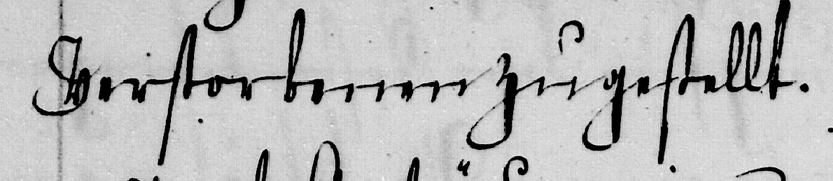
Verstorbenen zugestellt.
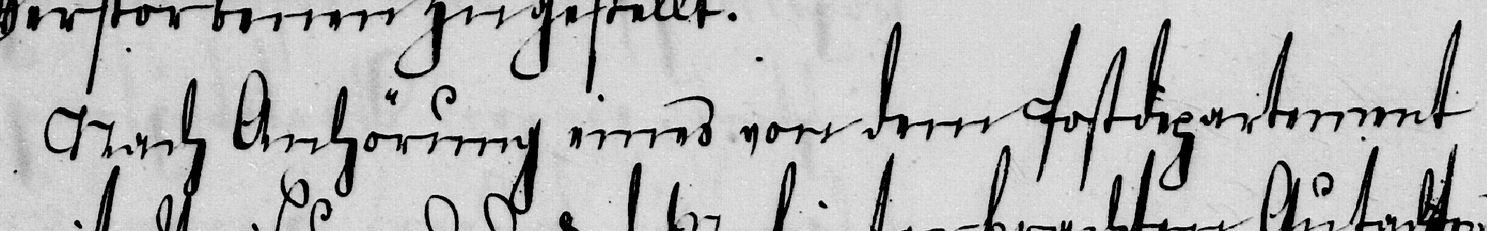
Nach Anhörung eines von dem Postdepartement
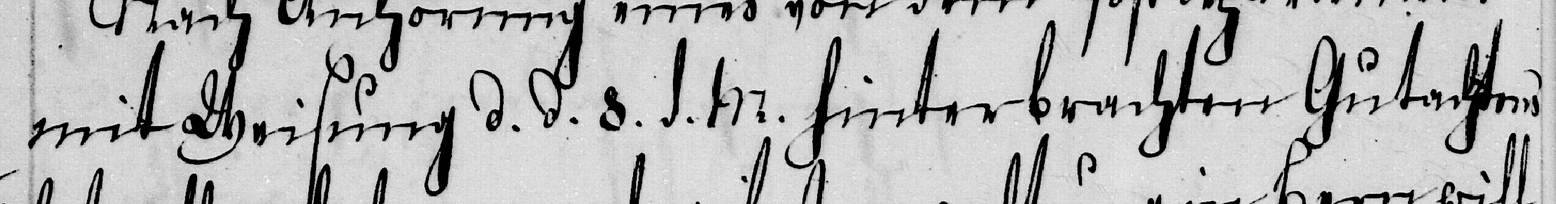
mit Weisung d. d. 8. d. M. hinterbrachten Gutachtens
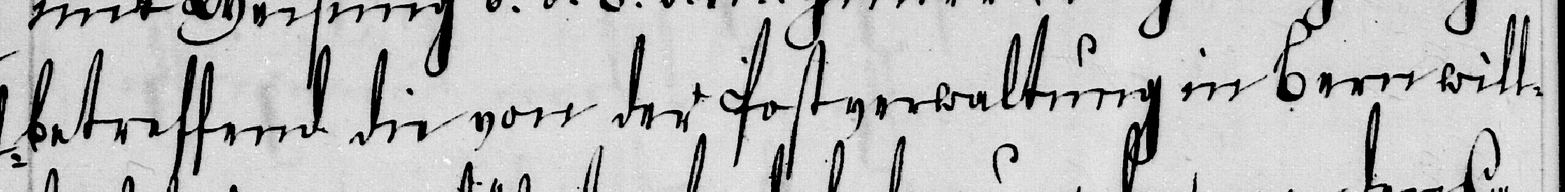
betreffend die von der Postverwaltung in Bern will¬
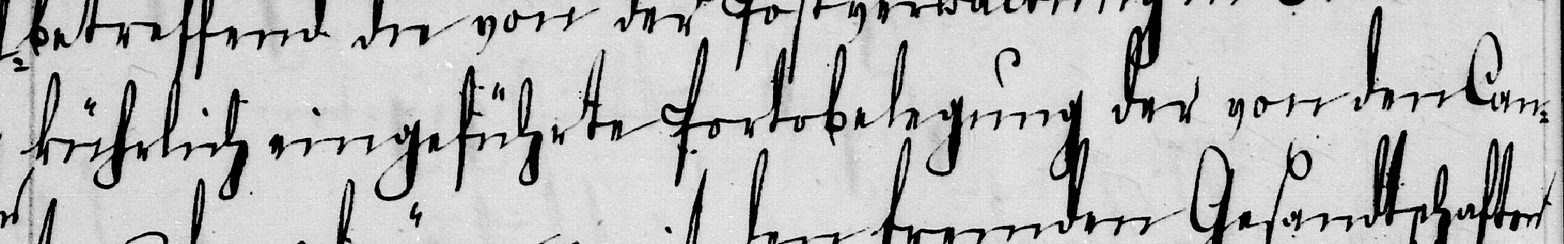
kührlich eingeführte Portobelegung der von den Can¬
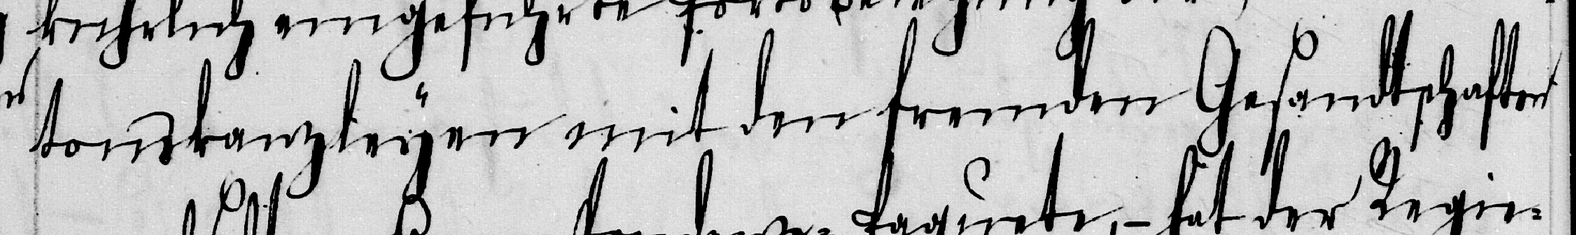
tonskanzleyen mit den fremden Gesandtschaften
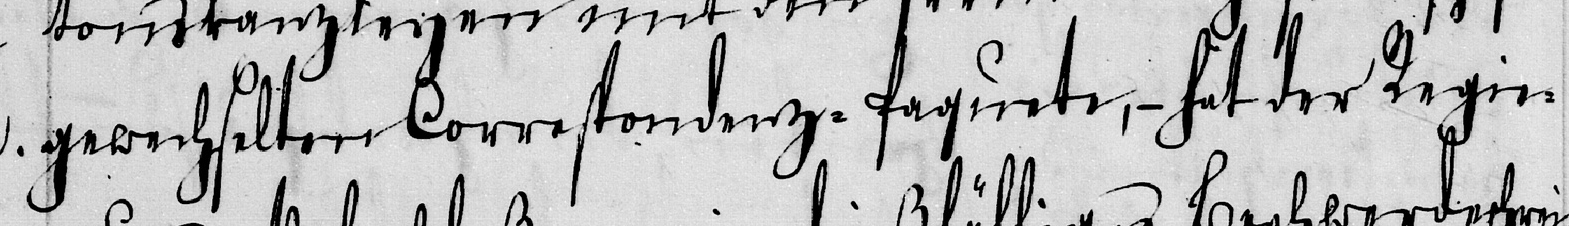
gewechselten Correspondenz-Paquete, – hat der Regie¬
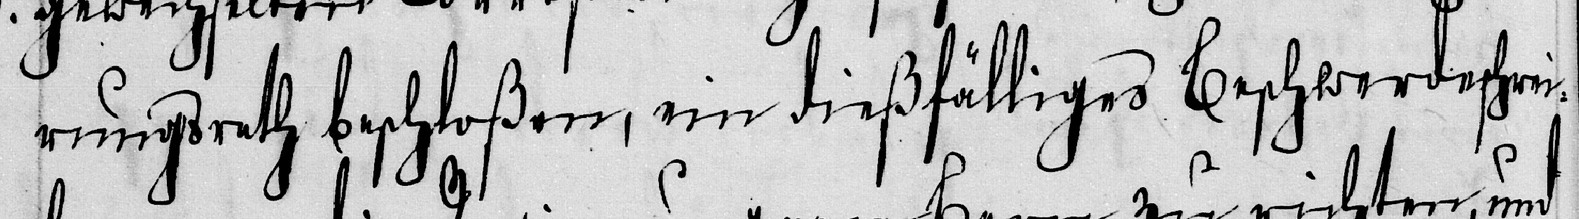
rungsrath beschloßen, ein dießfälliges Beschwerdeschr¬
